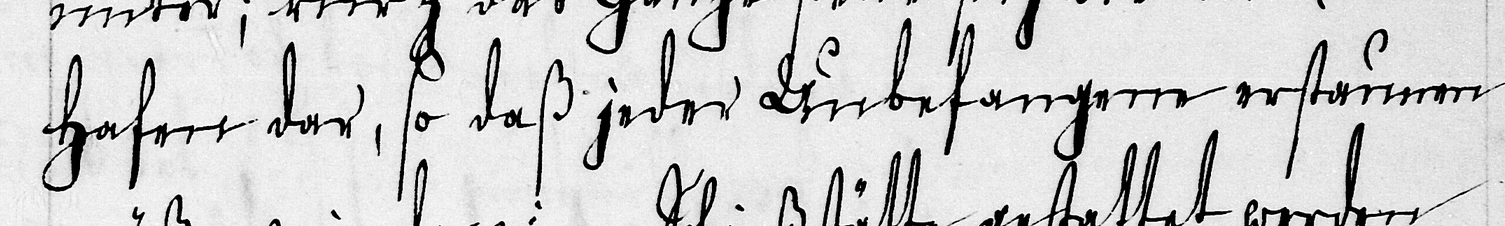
Hafen dar, so daß jeder Unbefangene erstaunen
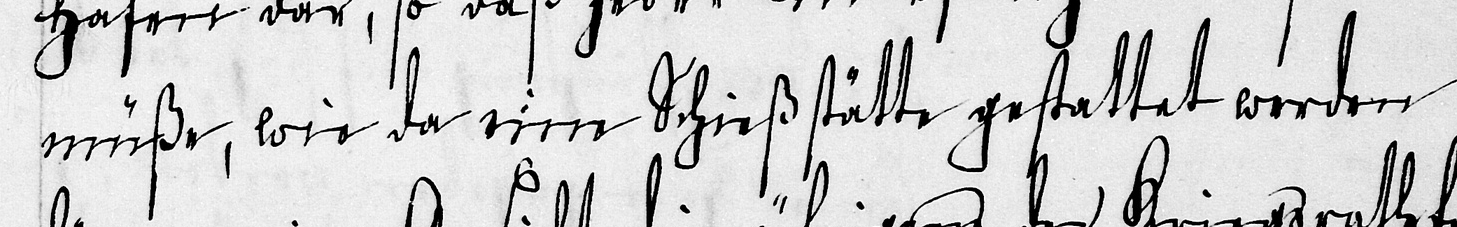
müße, wie da eine Schießstätte gestattet werden
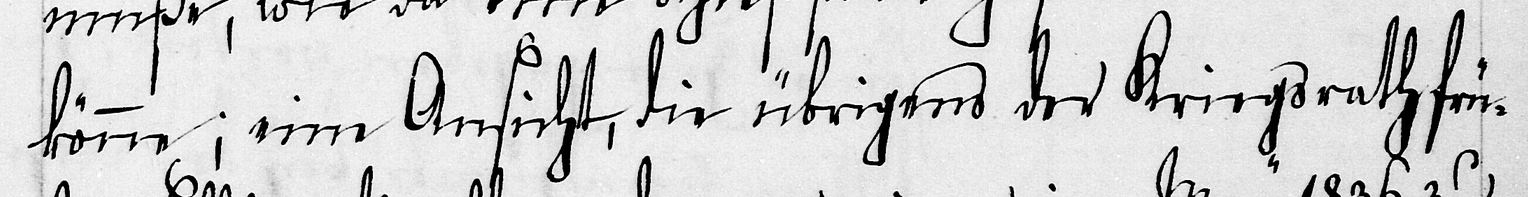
könne; eine Ansicht, die übrigens der Kriegsrath frü¬
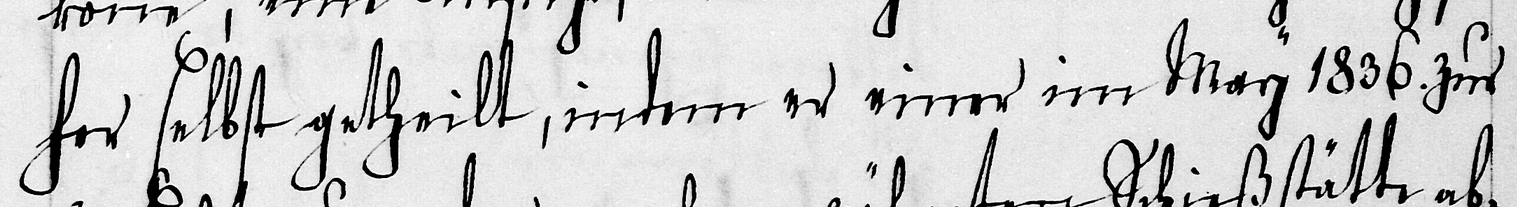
her selbst getheilt, indem er einer im May 1836. zur
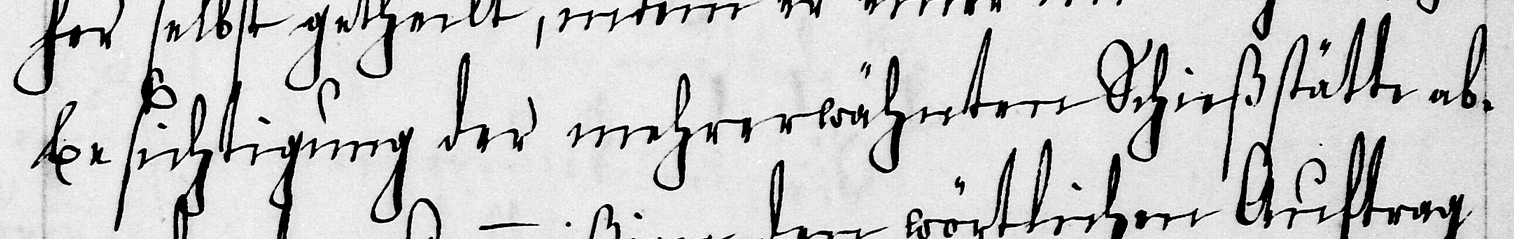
Besichtigung der mehrerwähnten Schießstätte ab¬
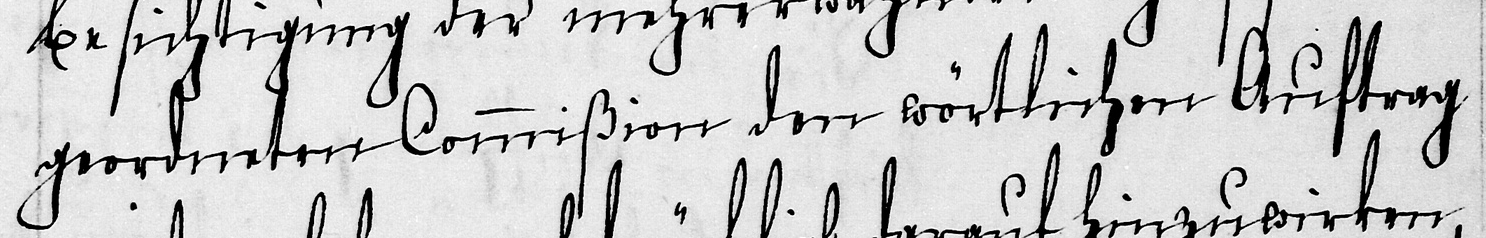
geordneten Commißion den wörtlichen Auftrag
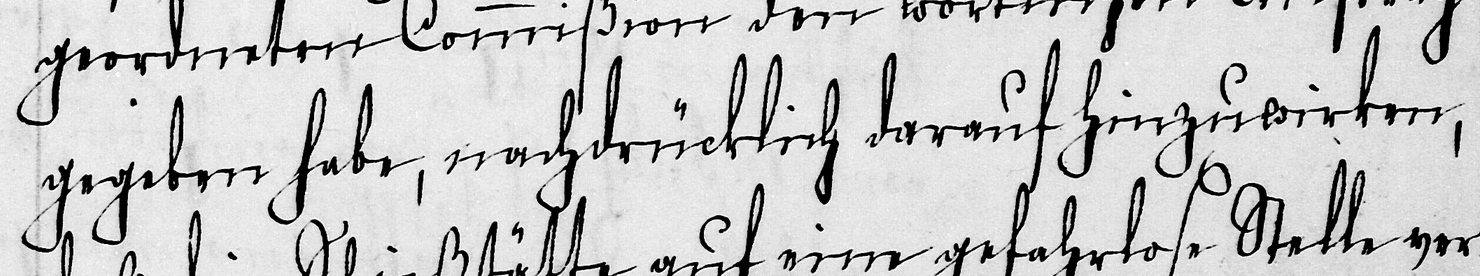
gegeben habe, nachdrücklich darauf hinzuwirken,
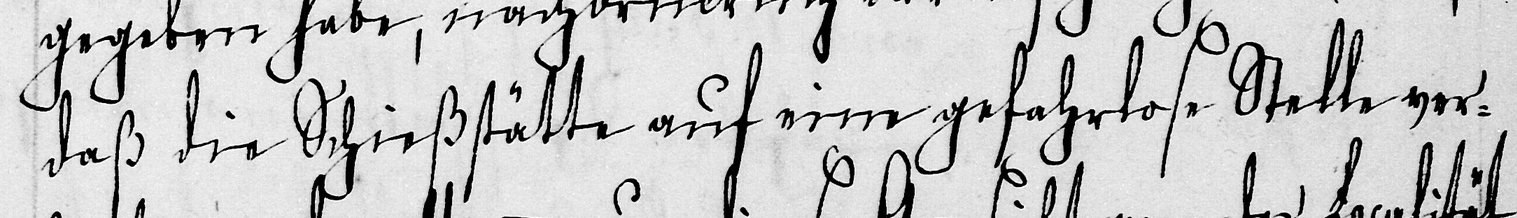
daß die Schießstätte auf eine gefahrlose Stelle ver¬
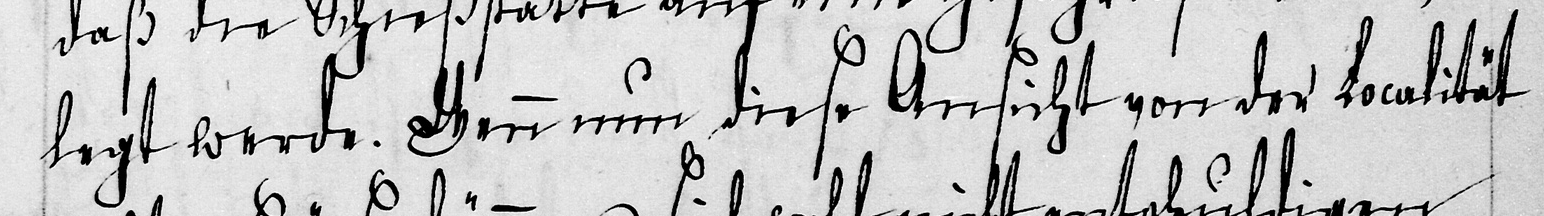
legt werde. Wenn nun diese Ansicht von der Localität
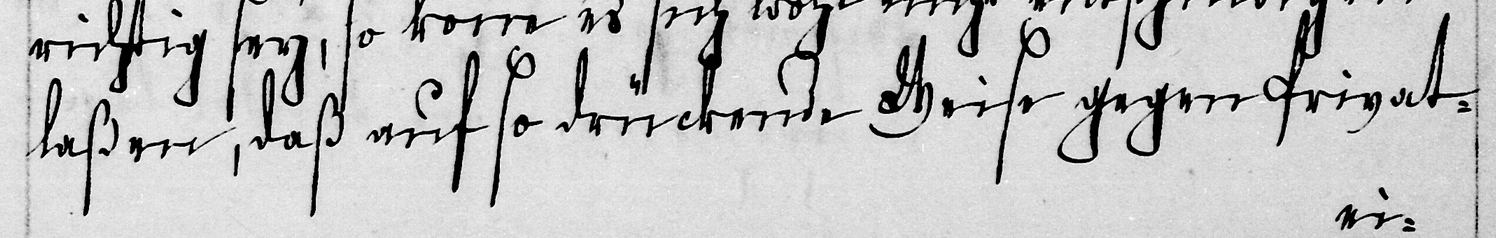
laßen, daß auf so drückende Weise gegen Privat-
